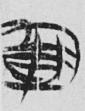軍
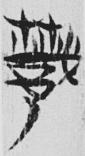○（散）
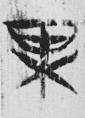果（裹）
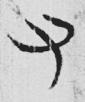又（有）
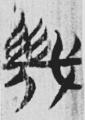幾（忌）
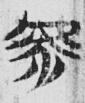{虍介}
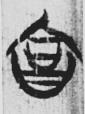合
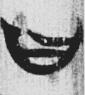曰
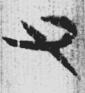又
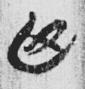臣
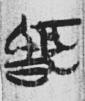䎽（聞）
